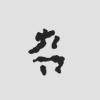𬒵
